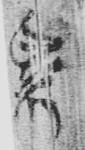○（奚）
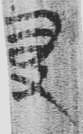○（得）
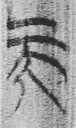而
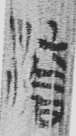清
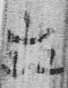卉（艸）
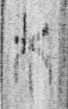木
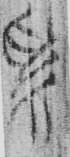○（奚）
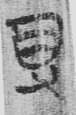○（得）
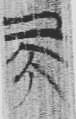而
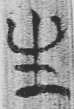生
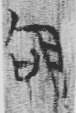含（禽）
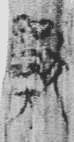獸
